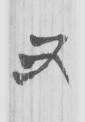又
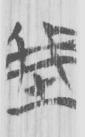{丘土}
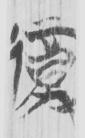復
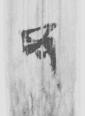邑
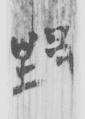郢
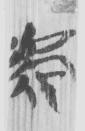虛
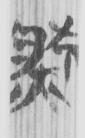然
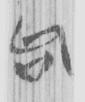句
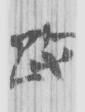攺
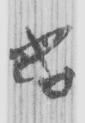{母口}
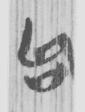句
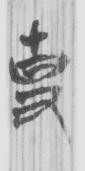吏
